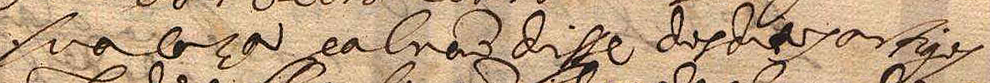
sua caza e al naõ disse dos ditos artigos
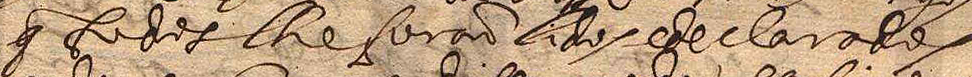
q̄ todos lhe foraõ lidos e declarados
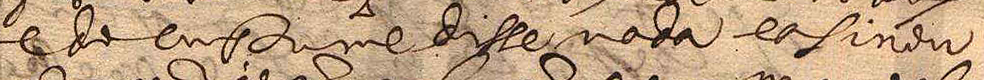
e do custume disse nada e asinou
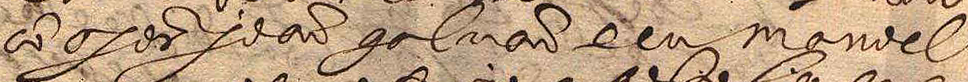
cō o sor̄ joaõ galuaõ e eu manoel
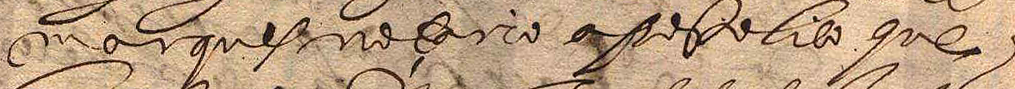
marques notario apostolico que
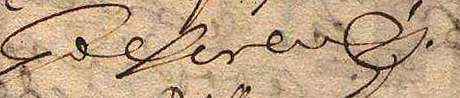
ho escreuj.
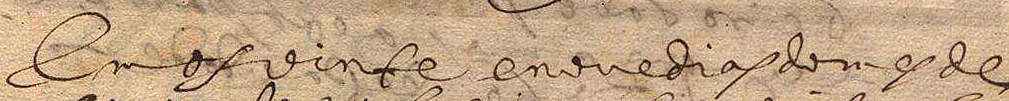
Em os vinte e noue dias do mes de
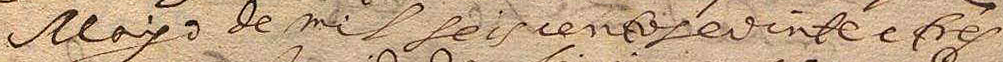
Mayo de mil seiscentos e vinte e tres
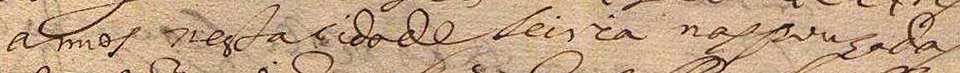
annos nesta cidade leiria nas pouzadas
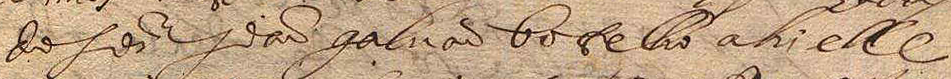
do sor̄ joaõ galuaõ botelho ahi elle
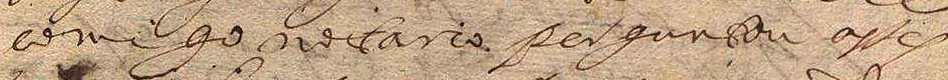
comigo notario perguntou as tes
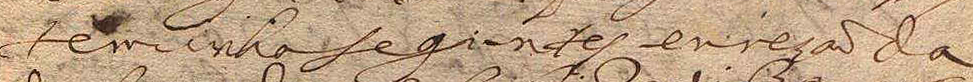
temunha segintes em rezaõ da
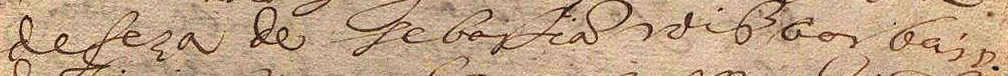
defeza de sebastiaõ rois̄ barbeiro
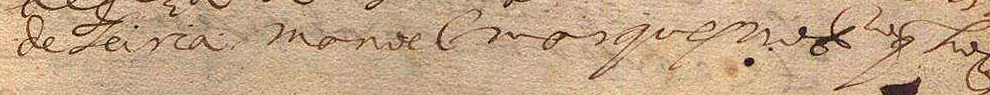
de Leiria manoel marques notro q̄ ho
